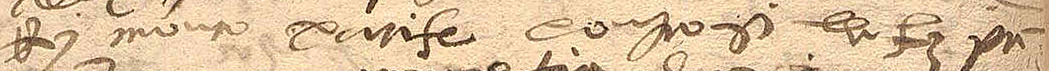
Rej mouro xarife e outrosi lhe fez pre
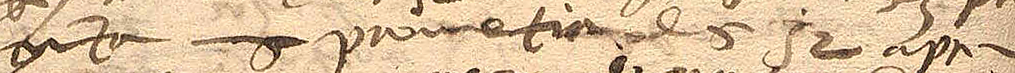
gūta se prometia de se Jr apre
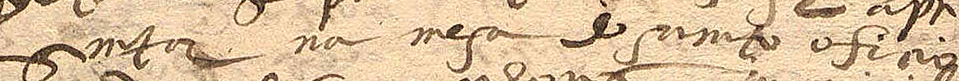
semtar na mesa do samto oficio
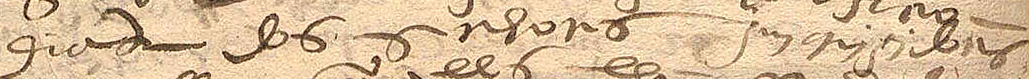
diāte dos senhores Jmqujsidores
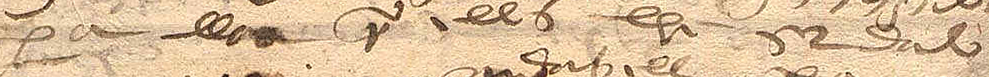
ꝑa lla p̄o elles lhe ser dado
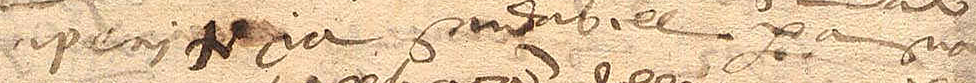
a penjtēcia saudavell ꝑa sua
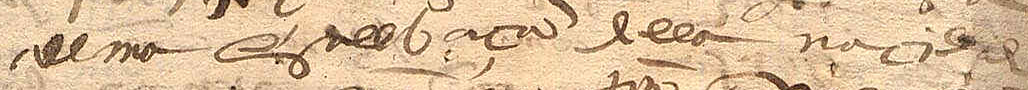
allma e sallvaçaõ della na cidade
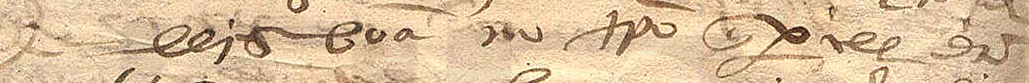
de lljsboa no tp̄o q̄ ꝑ ell dtō
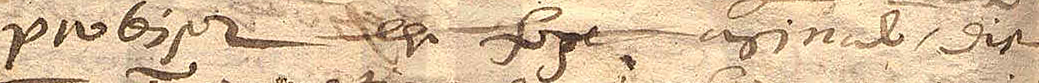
provisor lhe fose asinado / dise
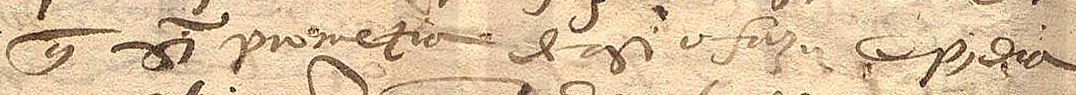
q̄ sī prometia de asi o fazer e pjdia
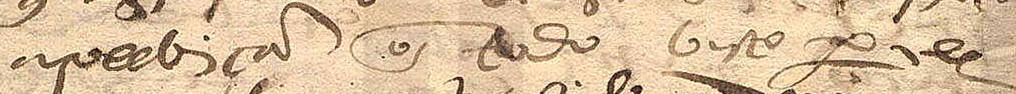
asollviçaõ o q̄ todo visto ꝑ ell
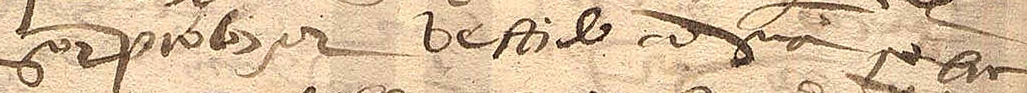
s̄or provisor vestido cō sua sobre
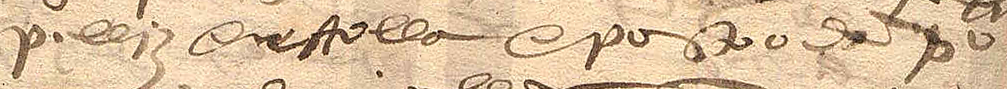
pelliz e estolla e posto o dtō po
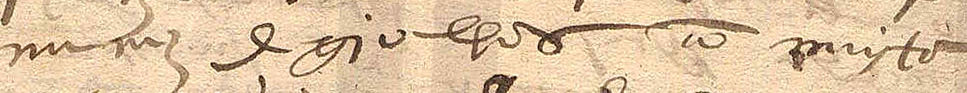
nunez de giolhos c̄o mujta
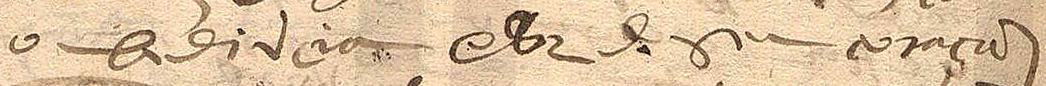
obediēcia e dor de seu coraçaõ
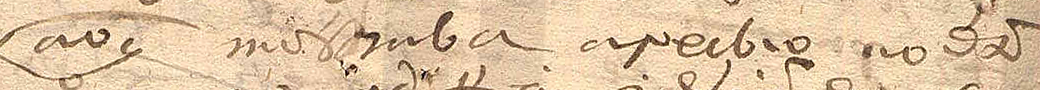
ao q̄ mostrava asollveo ao dt̄o
